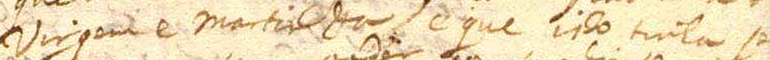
Virgem e martir &a e que isto tinha por
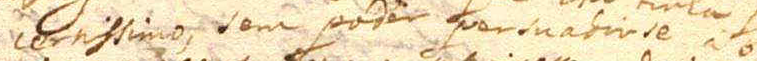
certissimo, sem poder persuadirse ao con
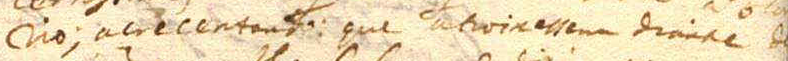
Rio, acrecentando que a troixessem diante do
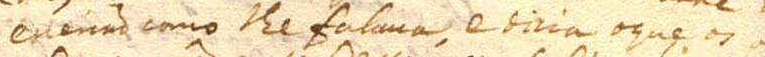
e ueriaõ como lhe falaua, e dizia o que os
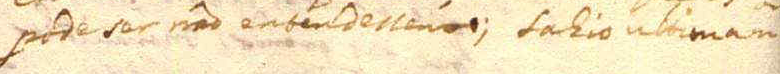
pode ser naõ entendessemos; sahio ultimam
